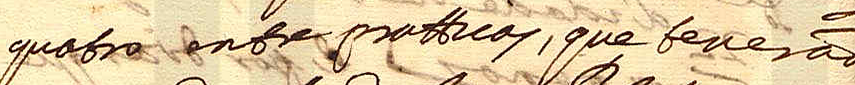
quatro entre pratticas, que teuerão
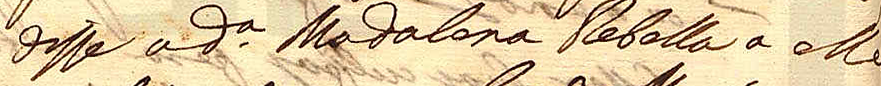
disse a d.a Madalena Rebella a elle
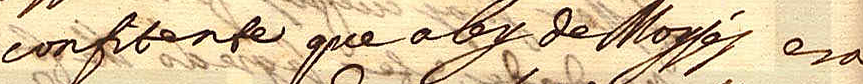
confitente que a ley de Moysés era
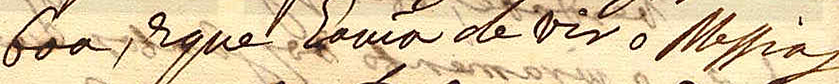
boa, E que hauia de vir o Messias
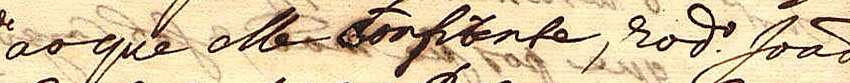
ao que elle confitente, E o d.o João
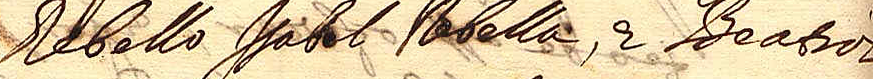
Rebello Jsabel Rebella, E Beatriz
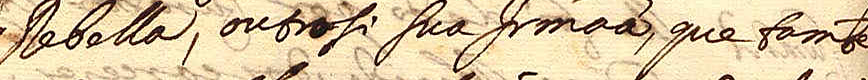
Rebella, outrosi sua Jrmāa, que tambē
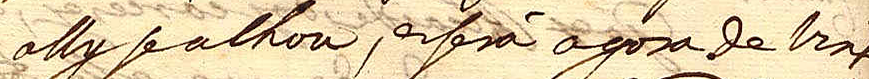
ally se achou, E será agora de vinte
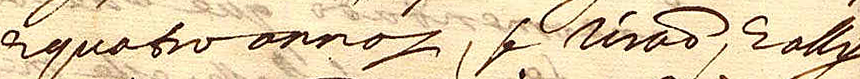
E quatro annos, se rirão, E ally
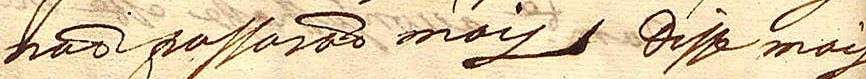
não passarão mais Disse mais
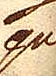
que
